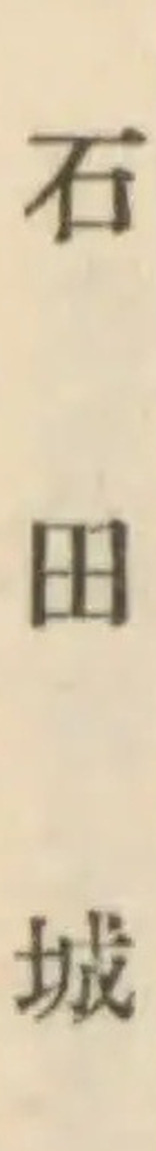石田城
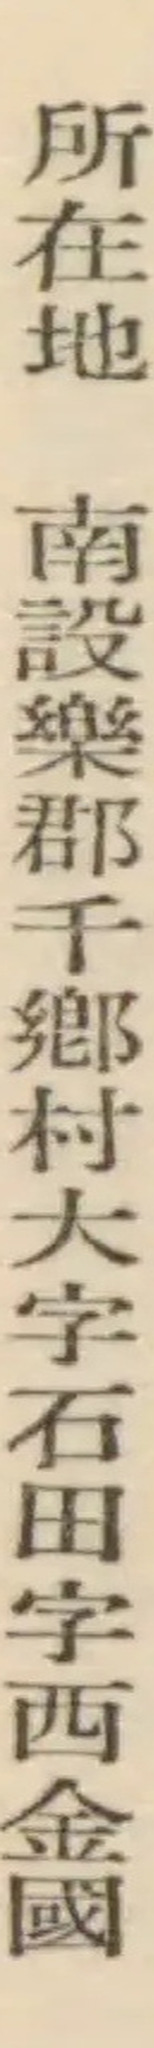所在地南設楽郡千郷村大字石田字西金国
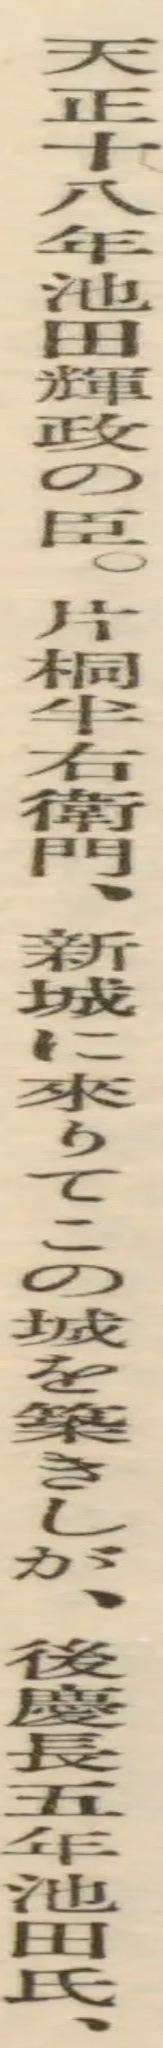天正十八年池田輝政の臣。片桐半右衛門、新城に来りてこの城を築きしが、後慶長五年池田氏、
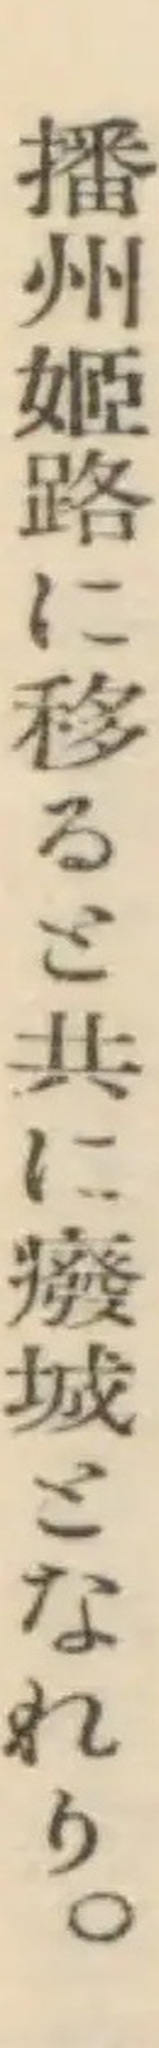播州姫路に移ると共に廃城となれり。
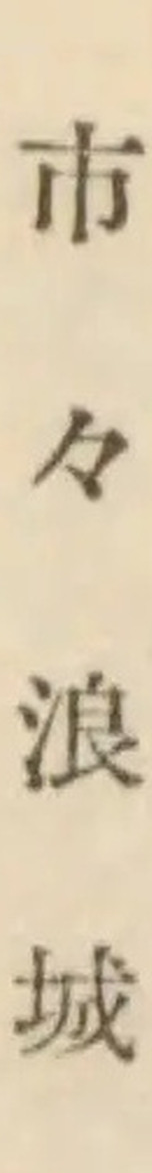市々浪城
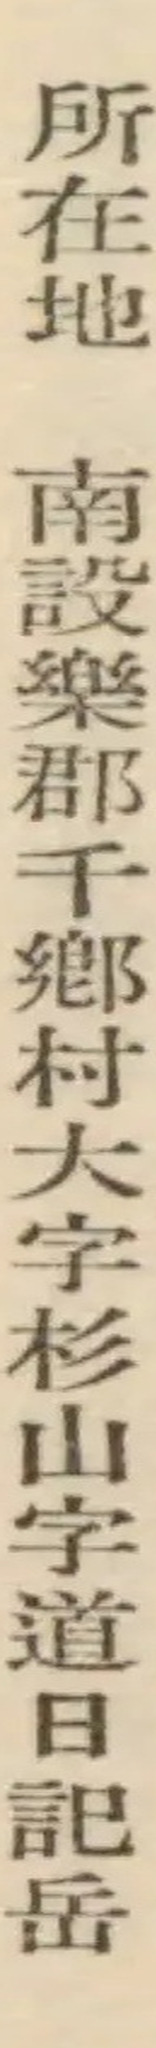所在地南設楽郡千郷村大字杉山字道日記岳
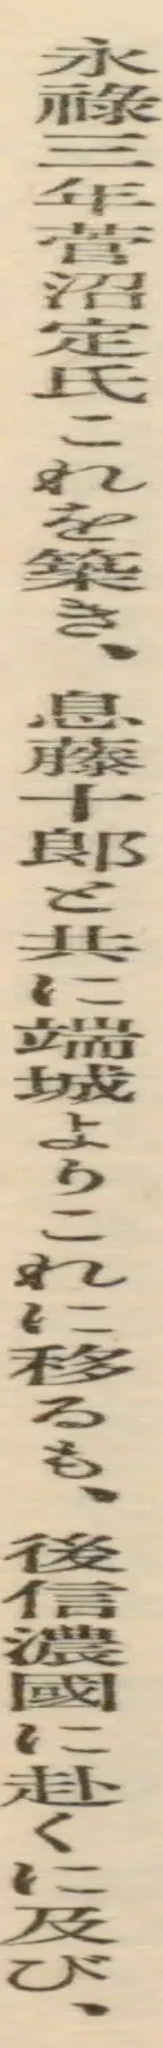永禄三年菅沼定氏これを築き、息藤十郎と共に端城よりこれに移るも、後信濃国に赴くに及び、
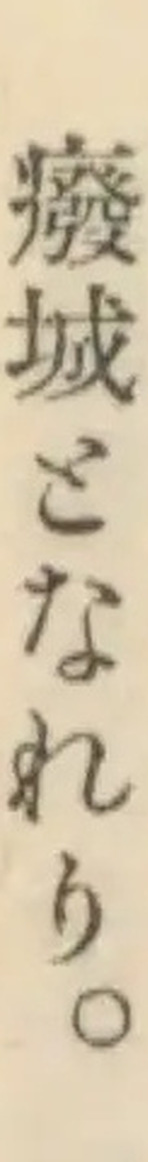廃城となれり。
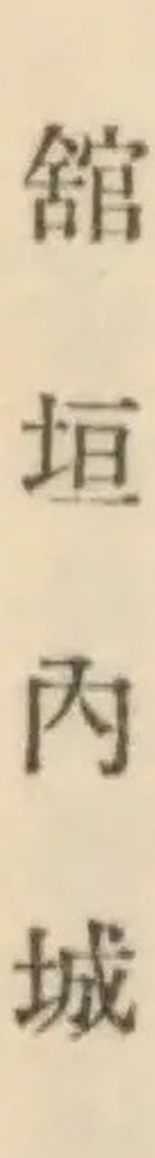舘垣内城
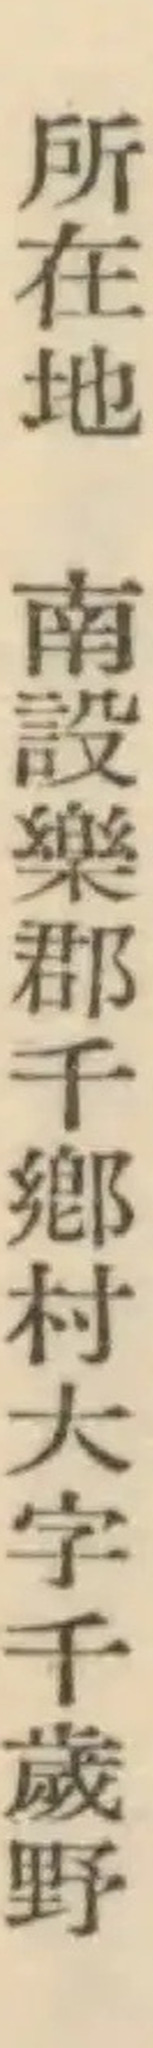所在地南設楽郡千郷村大字千歳野
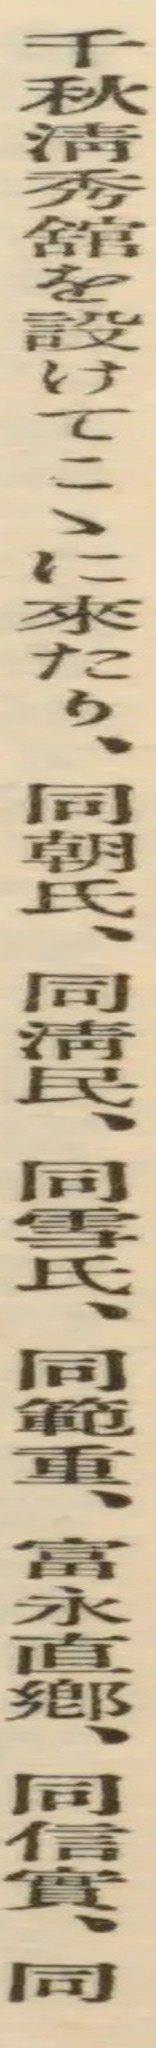千秋清秀舘を設けてこゝに来たり、同朝氏、同清民、同雪氏、同範重、富永直郷、同信実、同
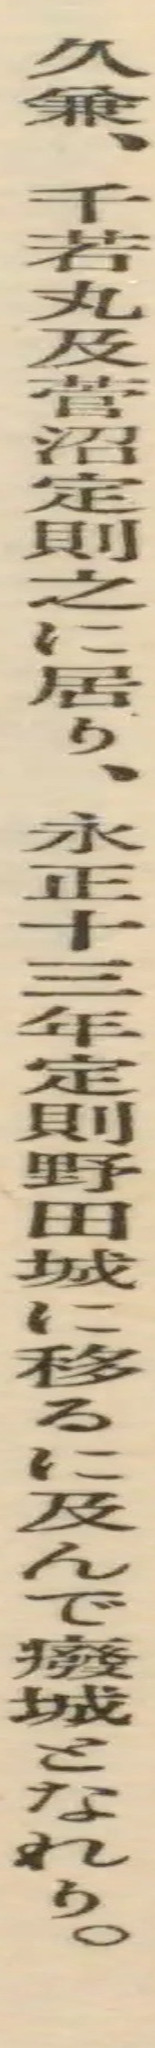久兼、千若丸及菅沼定則之に居り、永正十三年定則野田城に移るに及んで廃城となれり。
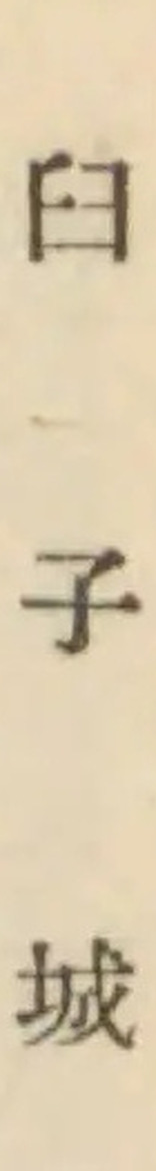臼子城
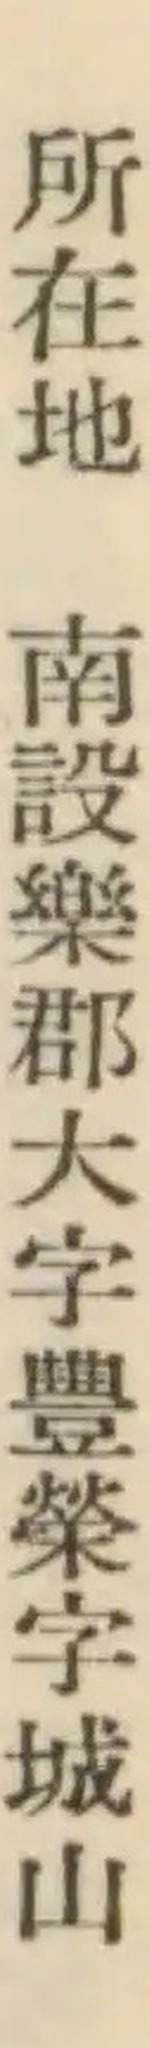所在地南設楽郡大字豊栄字城山
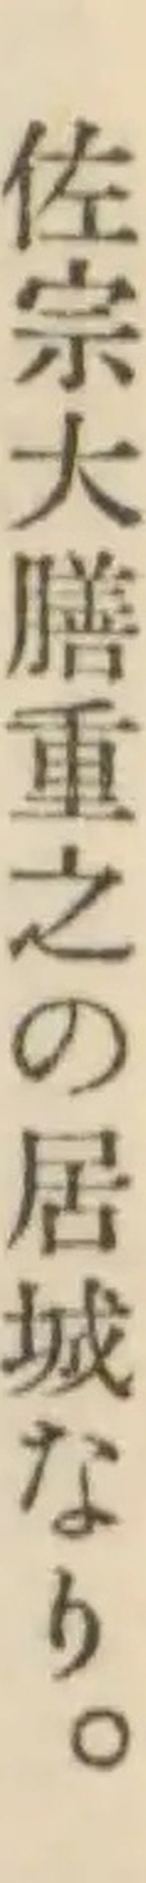佐宗大膳重之の居城なり。
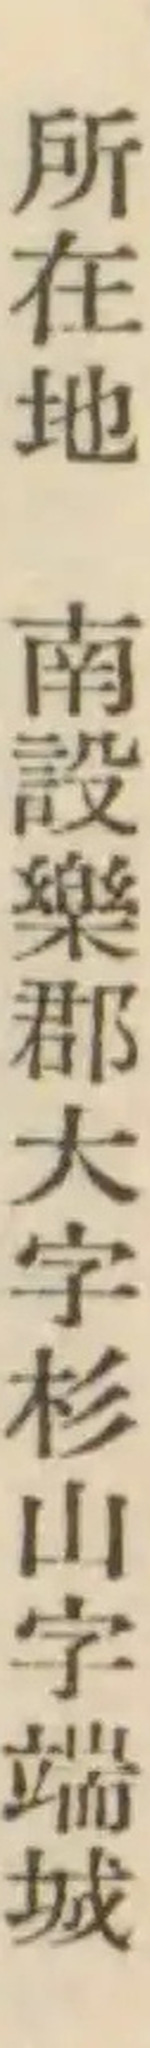所在地南設楽郡大字杉山字端城
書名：東三河之古城
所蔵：国立国会図書館 National Diet Library, JAPAN
